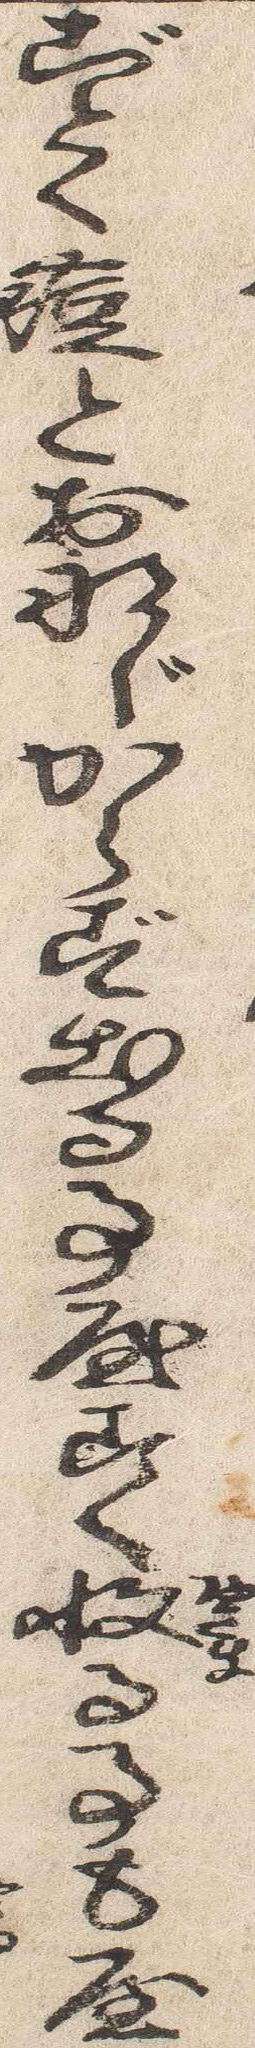ごとく痘とおなじからず出る事やすく収る事もや
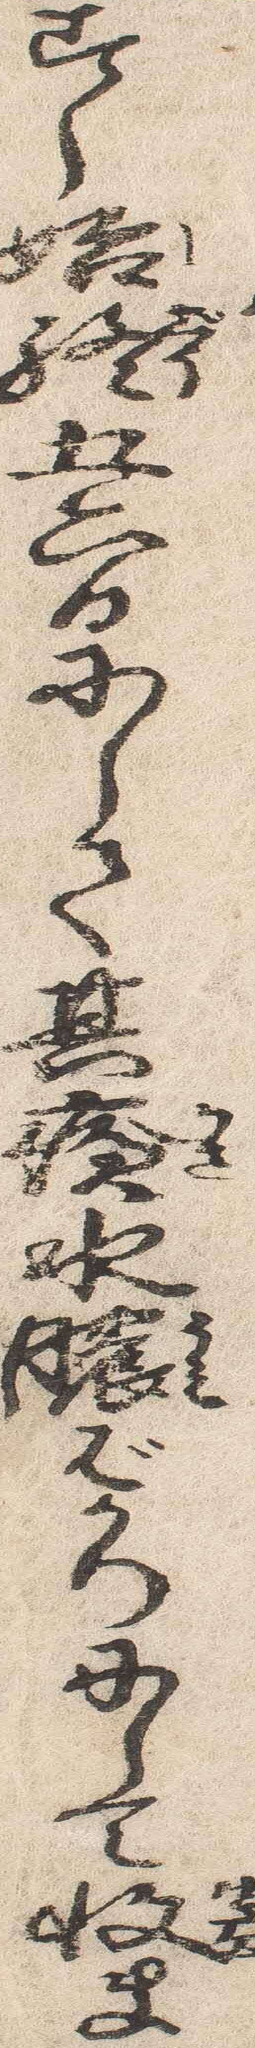すし始終五六日にして其瘡水膿ばかりにして収ま
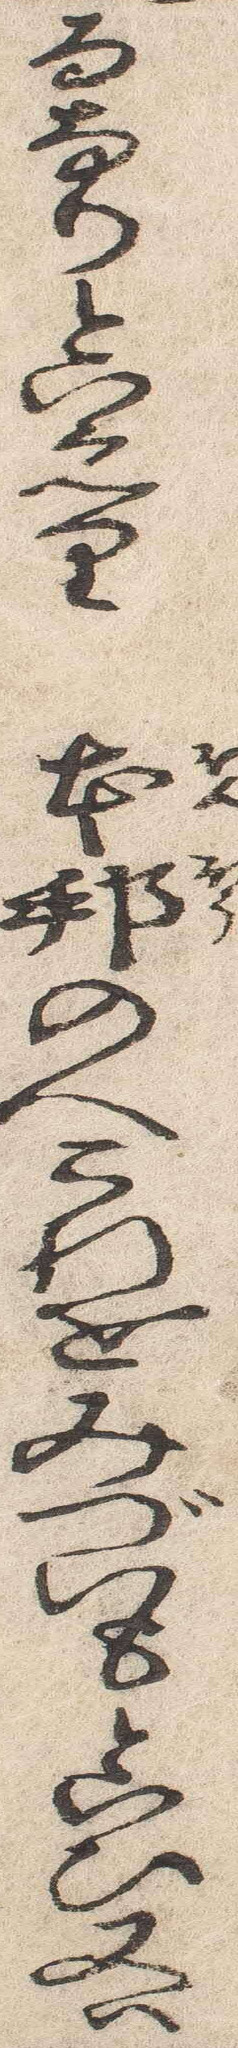るなりといえり本邦の人これをみづいもといひ又は
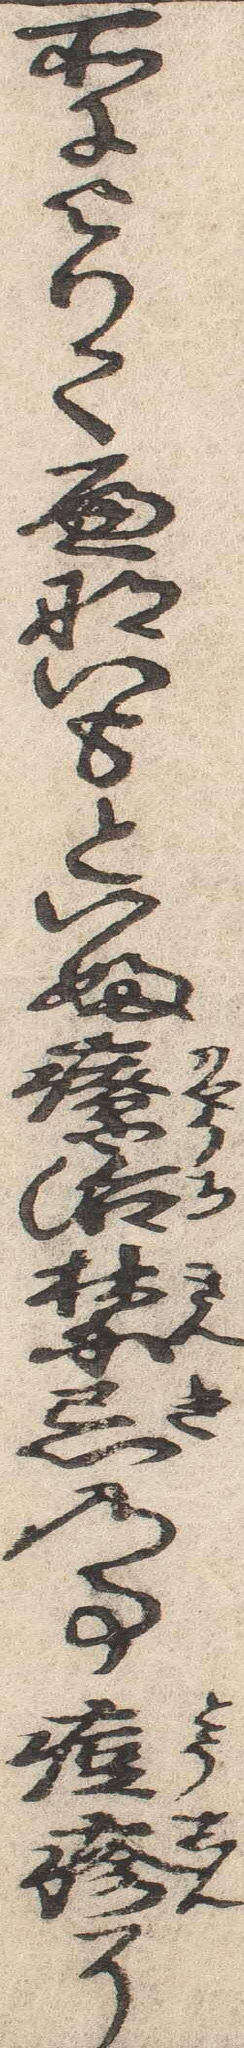所によりてへないもといふ療治禁忌の事痘疹に
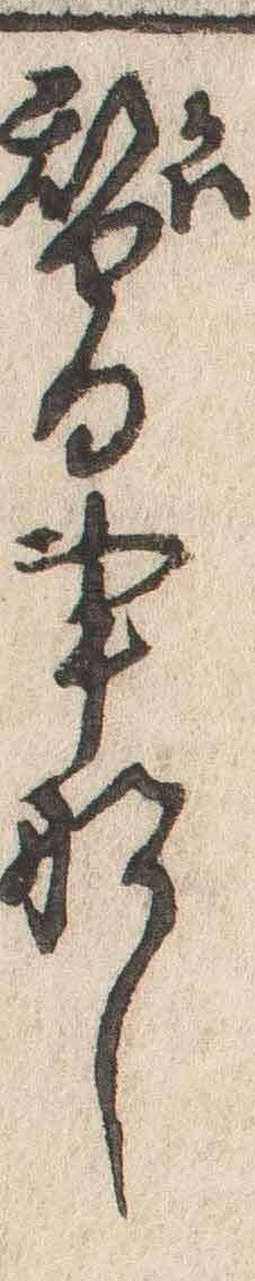替る事なし
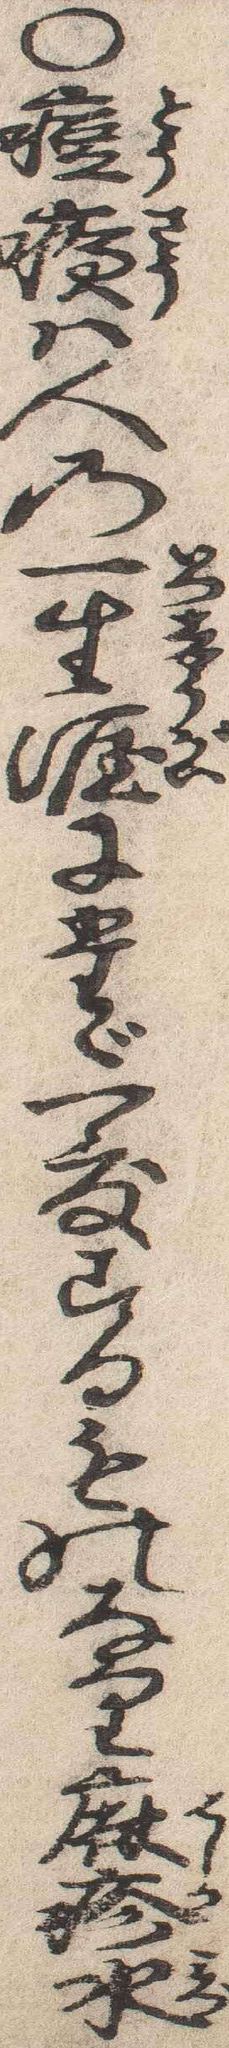○痘瘡は人の一生涯にたゞ一度するものなり麻疹水
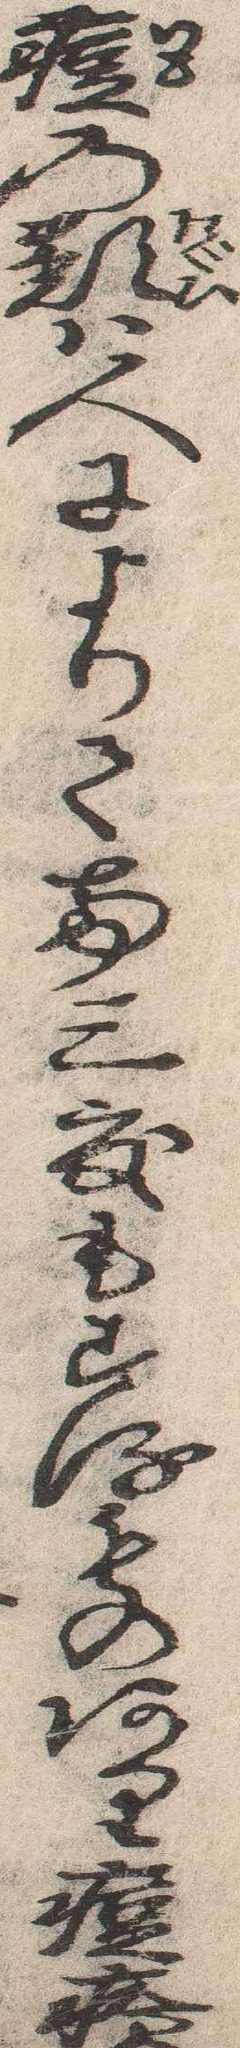痘の類は人によりて両三度もするものあり痘瘡
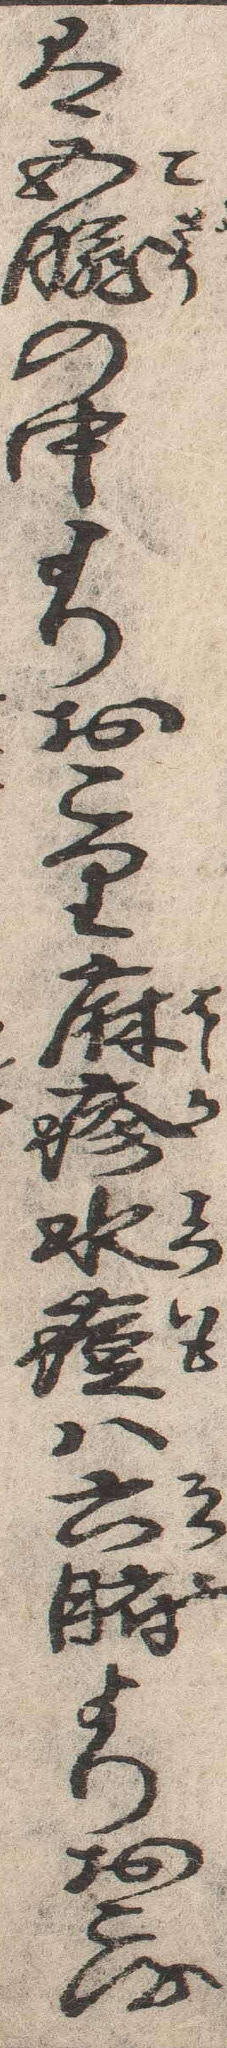は五臓の中よりおこり麻疹水痘は六腑よりおこる
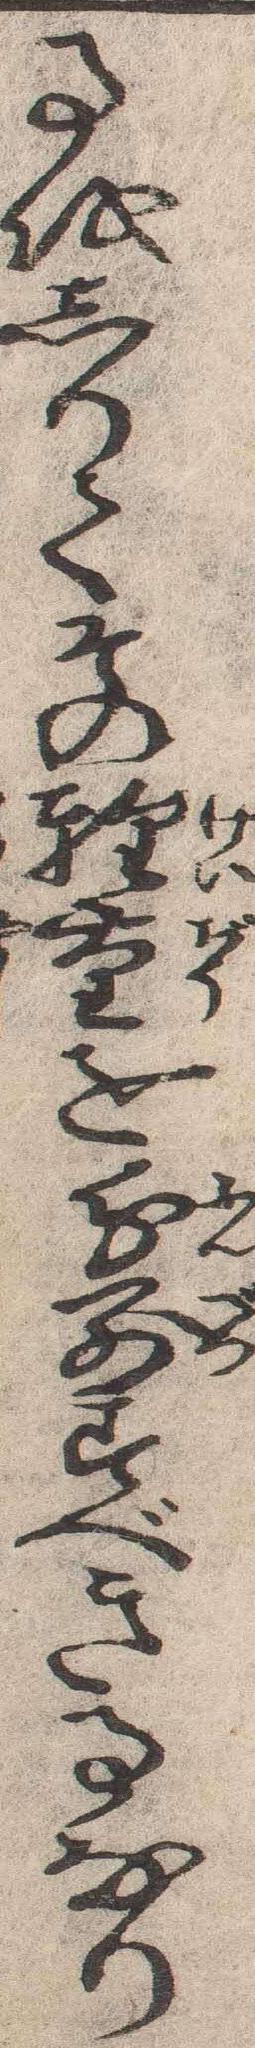事をしりてその軽重を分別すべき事なり

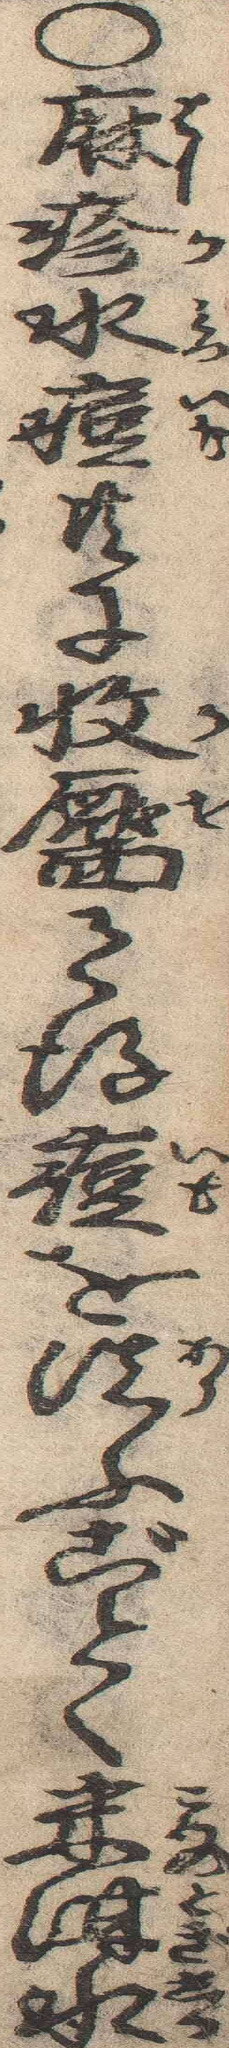○麻疹水痘共に収靨て後痘を洗ふごとく米泔水
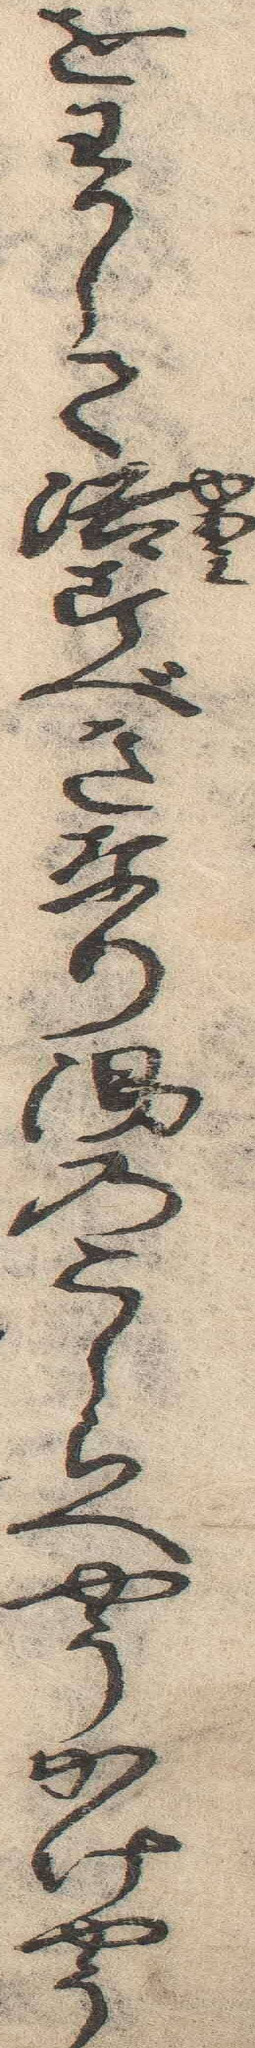をわかして浴すべきなり湯のこしらへやうかけやう
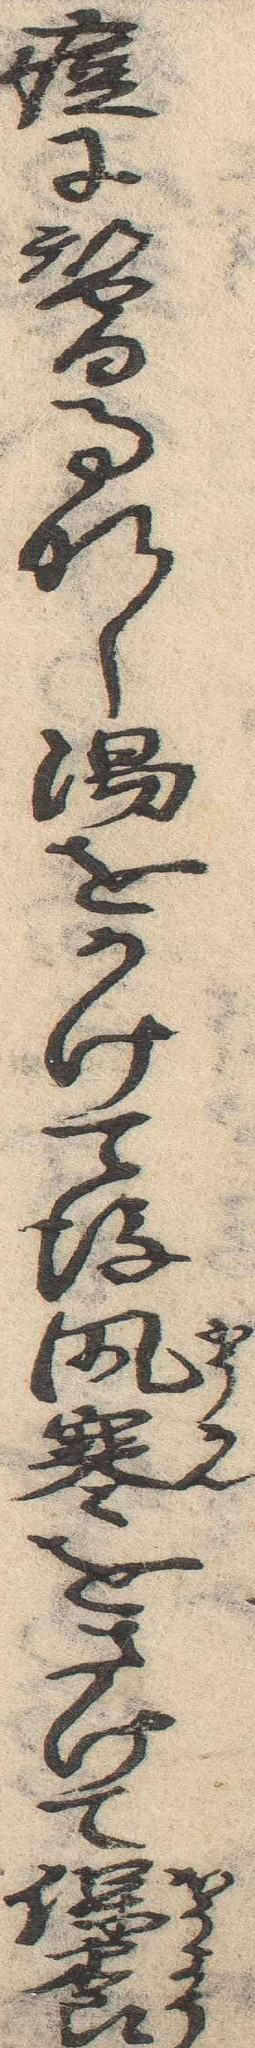痘に替る事なし湯をかけて後風寒をさけて保養
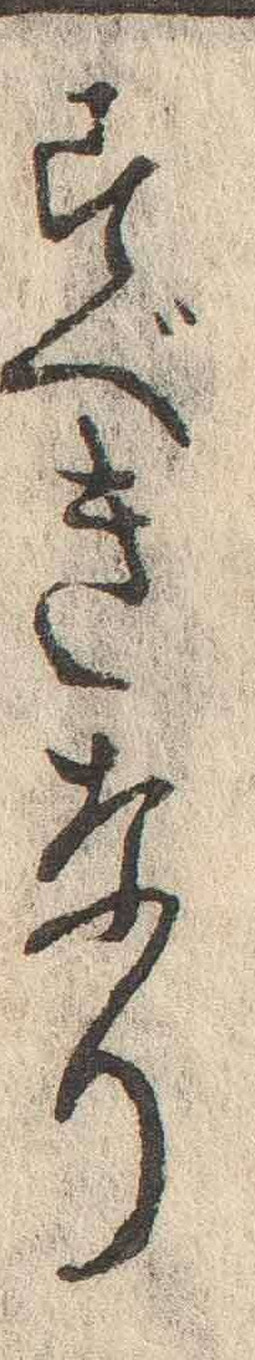すべきなり

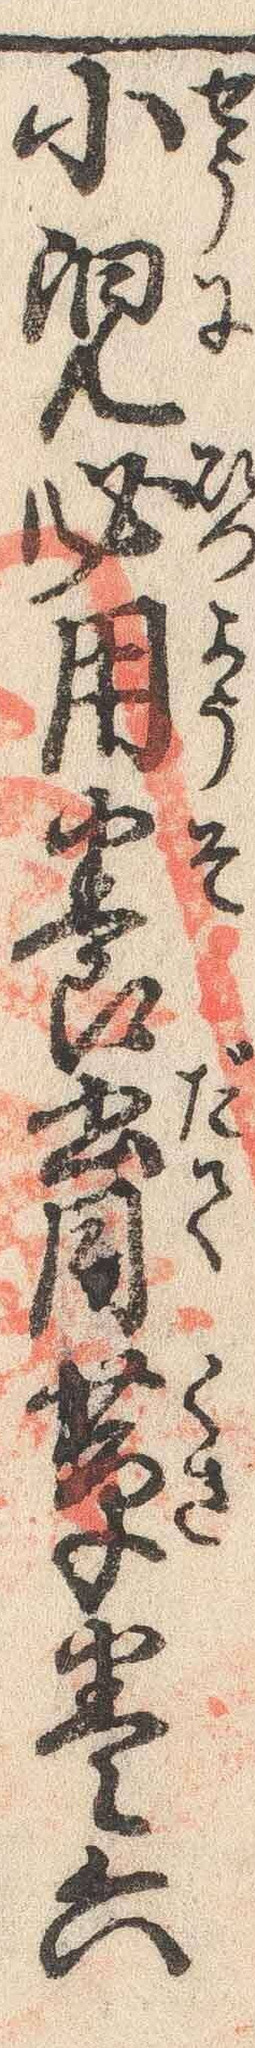小児必用養育草巻六
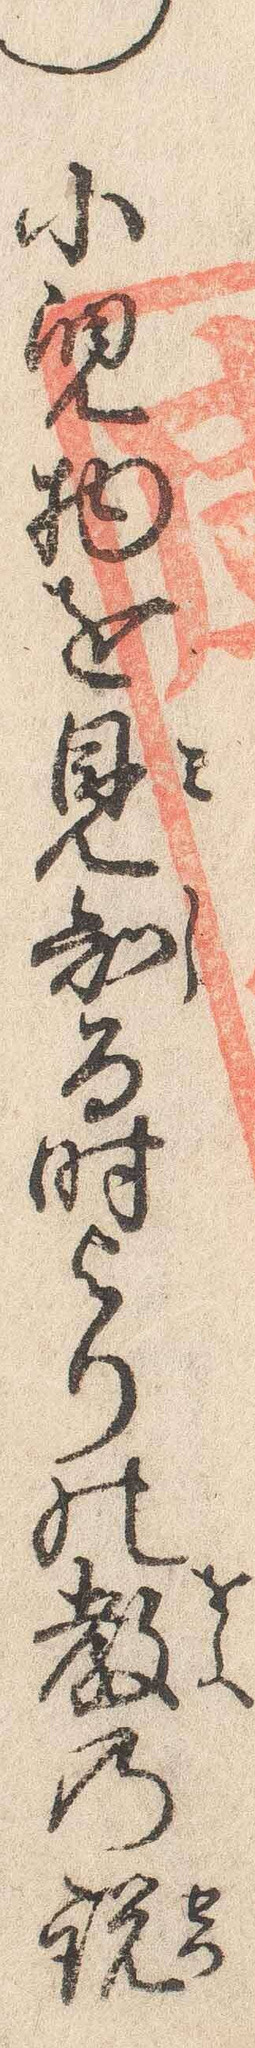㊀小児物を見知る時よりの教の説
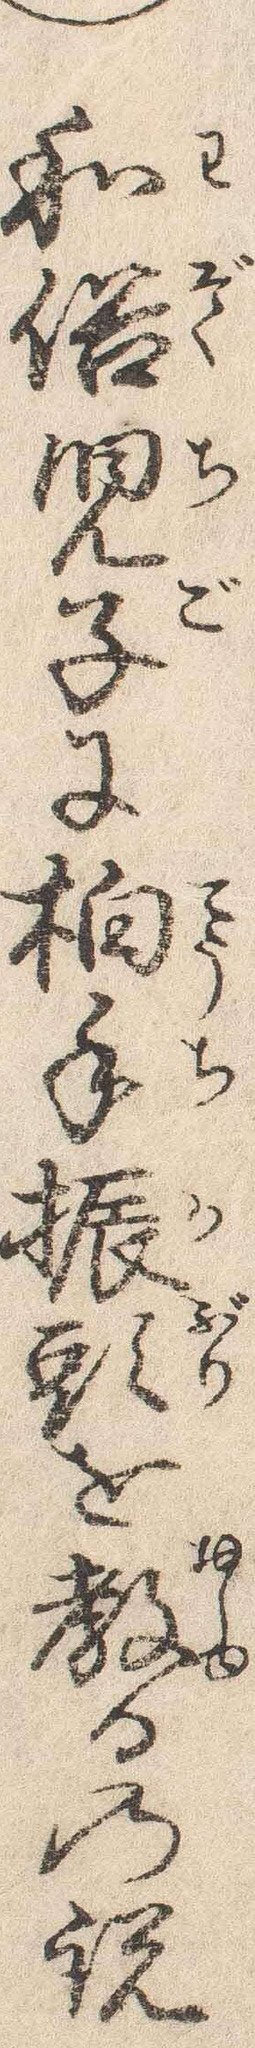㊁和俗児子に拍手振頭を教るの説
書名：小児必用養育草
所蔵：東京学芸大学附属図書館 国文学研究資料館
